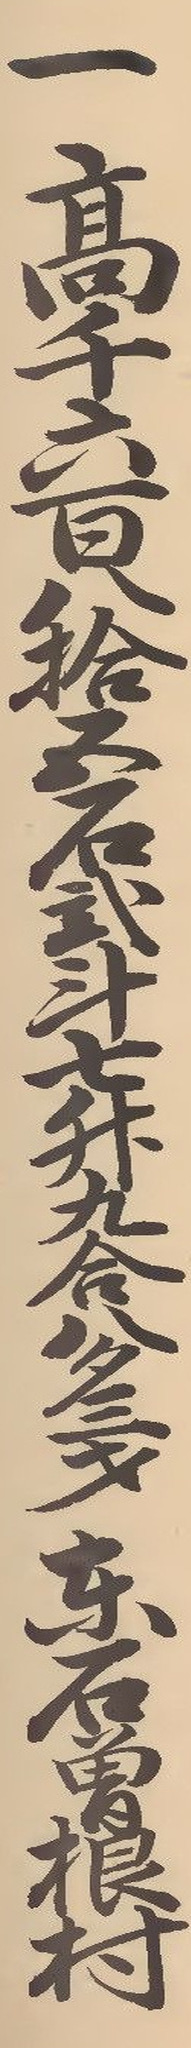一高千六百八拾五石弐斗七升九合八勺三才東石曽根村
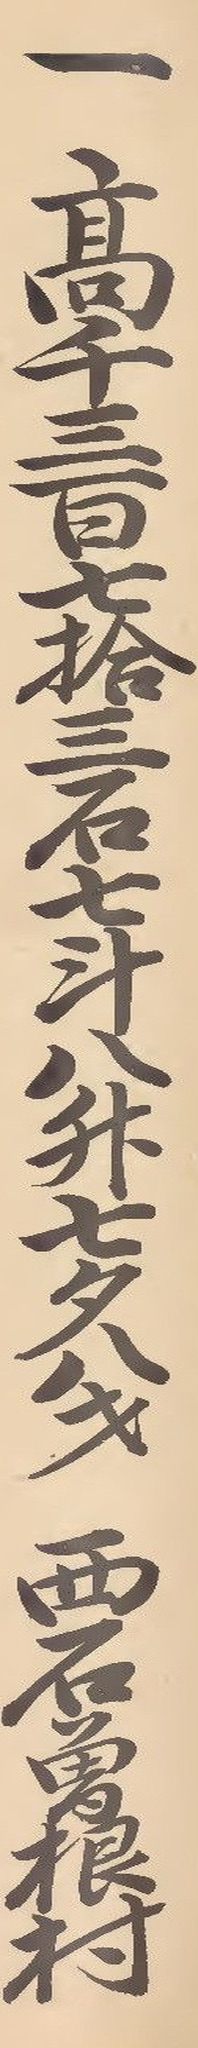一高千三百七拾三石七斗八升七勺八才西石曽根村
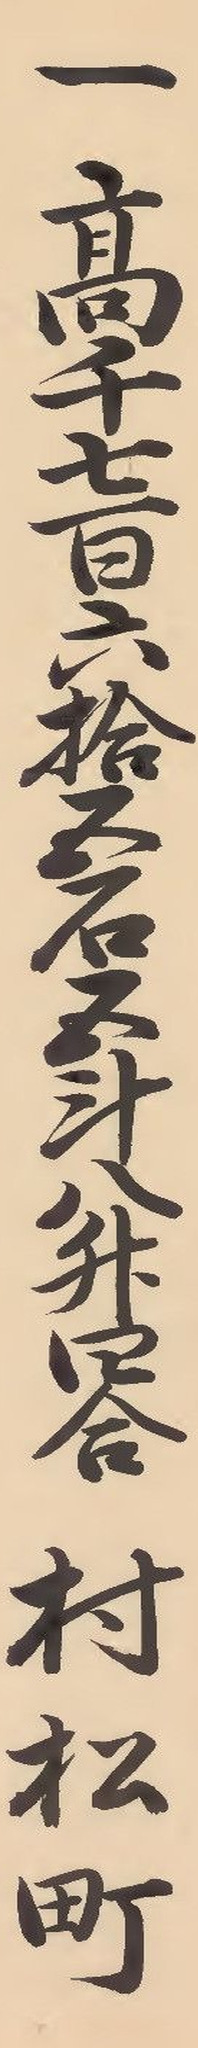一高千七百六拾五石五斗八升四合村松町
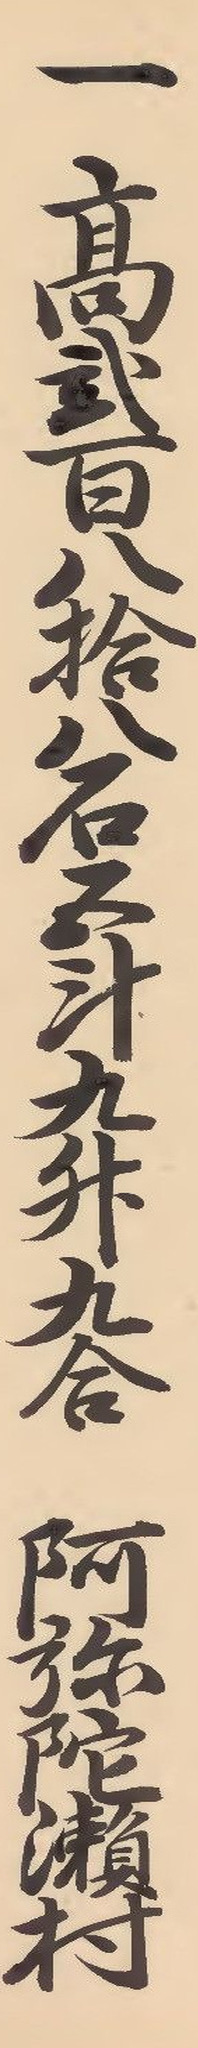一高弐百八拾八石五斗九升九合阿弥陀瀬村
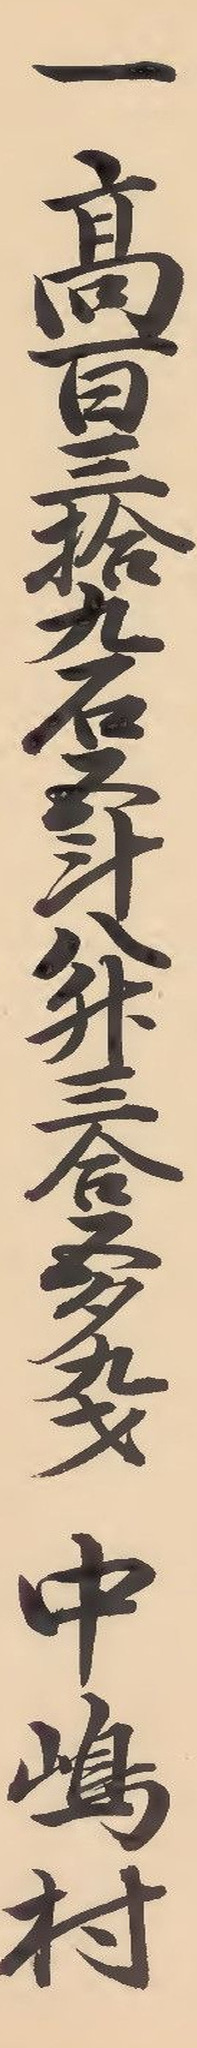一高百三拾九石五斗八升三合五勺九才中島村

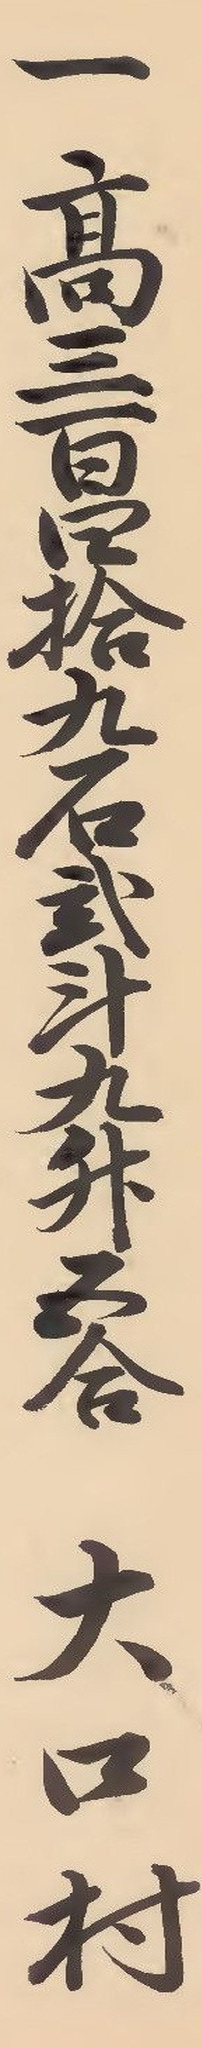一高三百四拾九石弐斗九升五合大口村
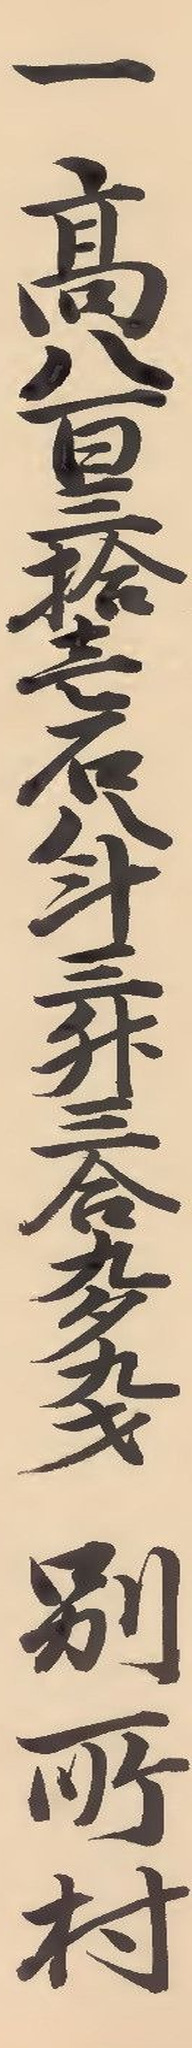一高八百三拾壱石八斗三升三合九勺九才別所村
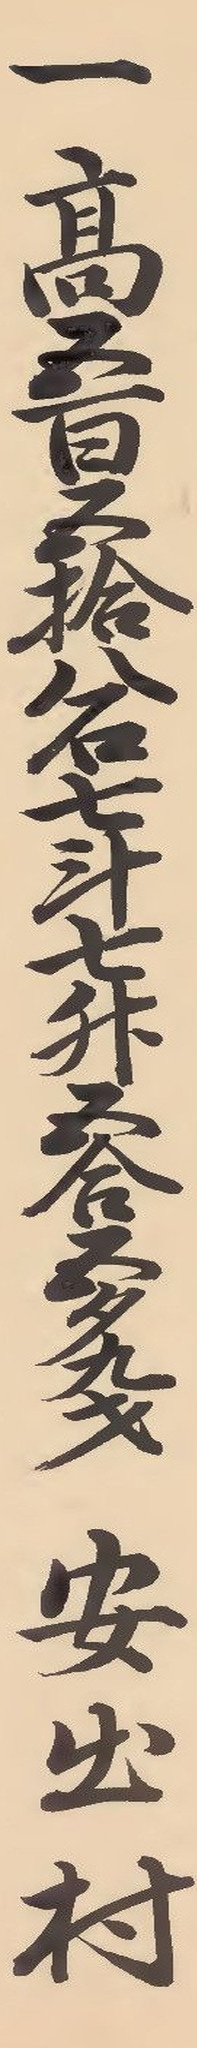一高五百五拾八石七斗七升五合五勺九才安出村
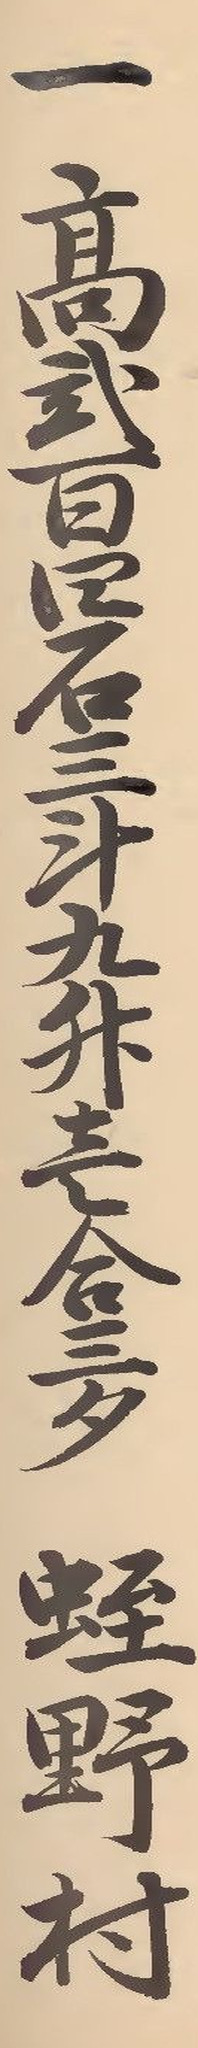一高弐百四石三斗九升壱合三勺蛭野村
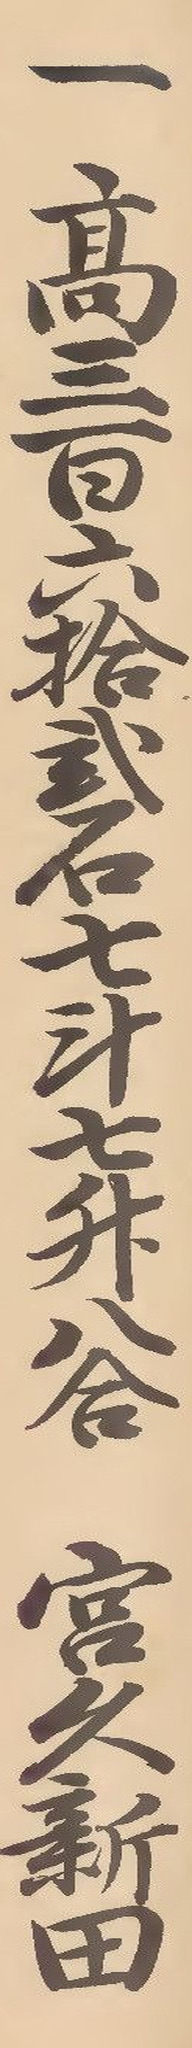一高三百六拾弐石七斗七升八合宮久新田
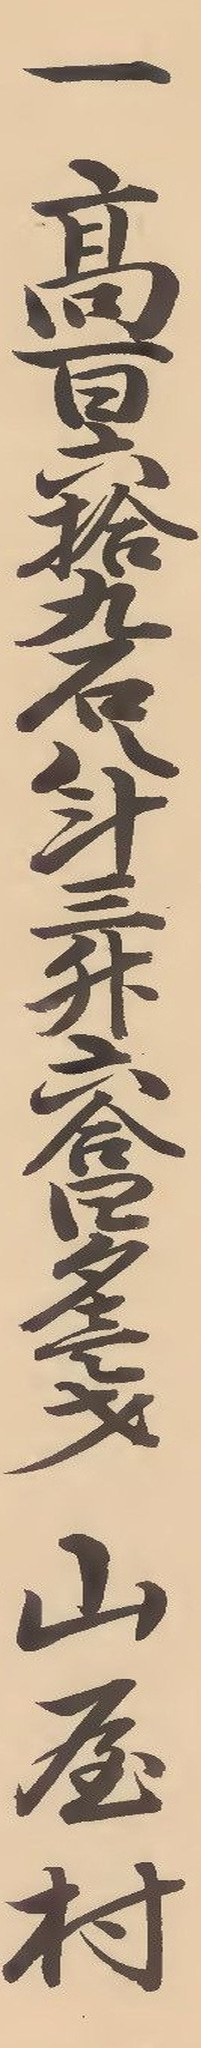一高百六拾九石八斗三升六合四勺壱才山屋村
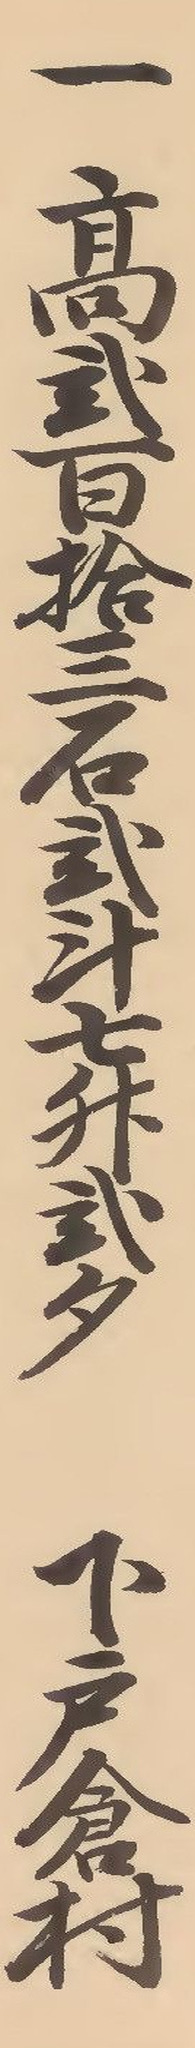一高弐百拾三石弐斗七升弐勺下戸倉村
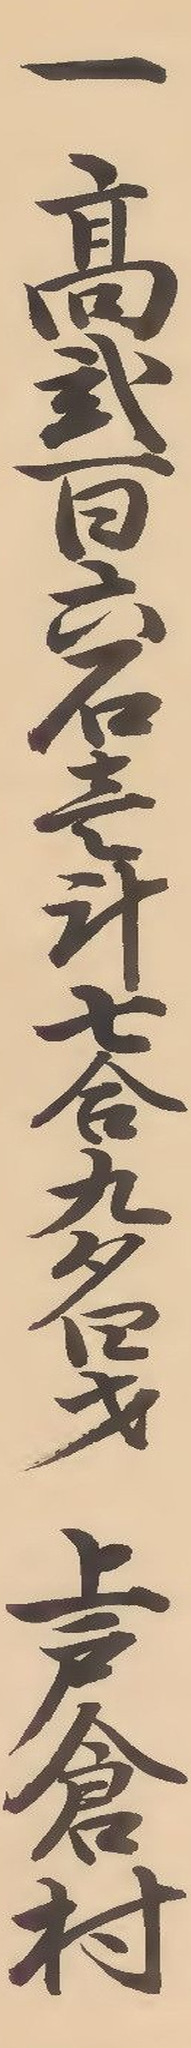一高弐百六石壱斗七合九勺四才上戸倉村

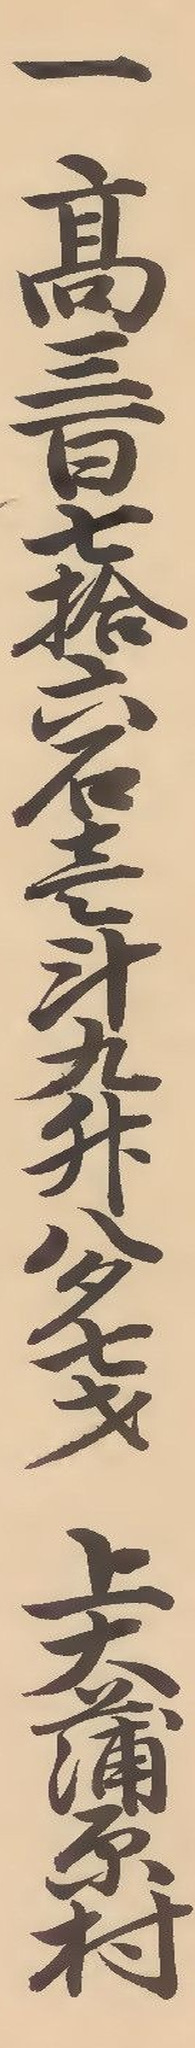一高三百七拾六石壱斗九升八勺七才上大蒲原村
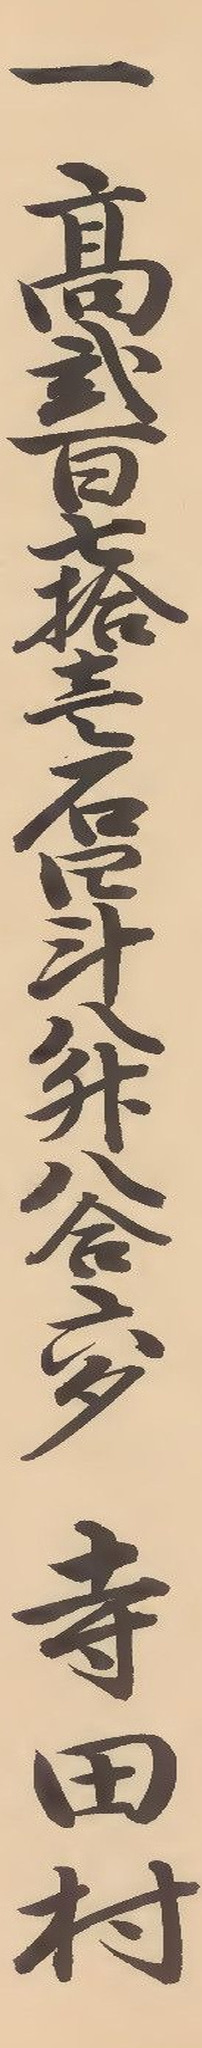一高弐百七拾壱石四斗八升八合六勺寺田村
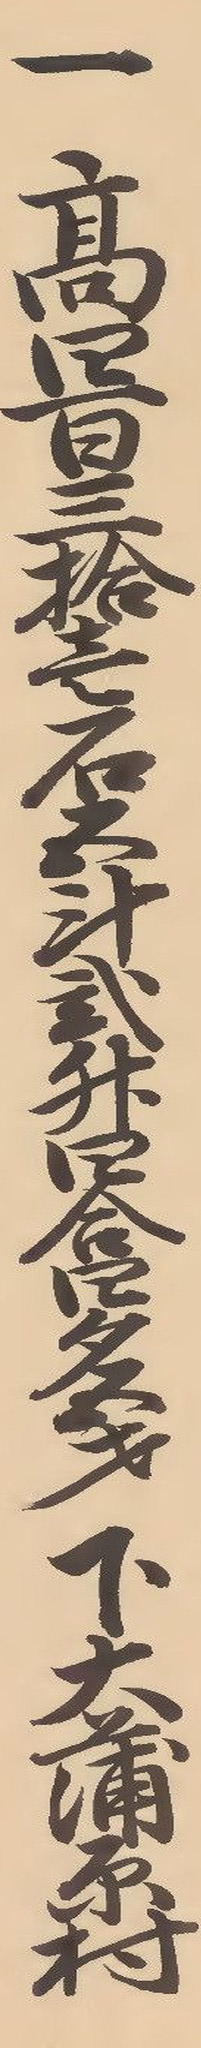一高四百三拾壱石五斗弐升四合四勺五才下大蒲原村
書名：越後国郷帳　下
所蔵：国立公文書館 National Archives of Japan
